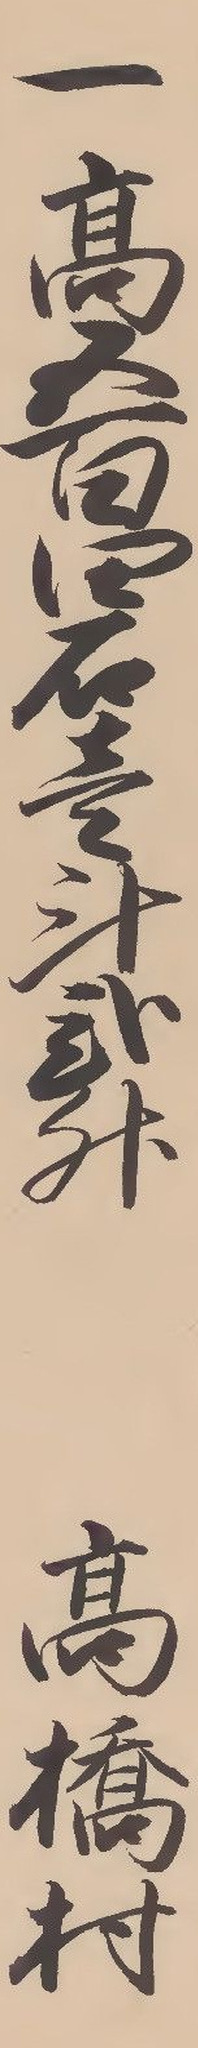一高五百四石壱斗弐升高橋村
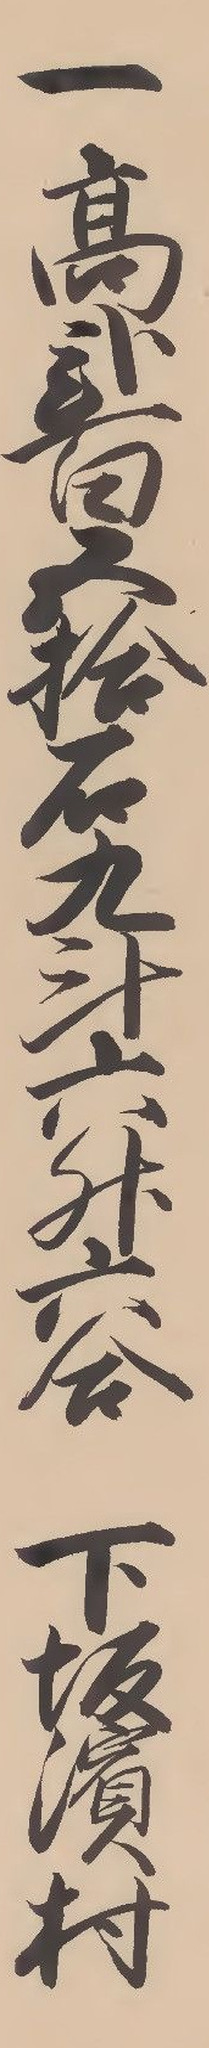一高弐百五拾石九斗六升六合下坂浜村
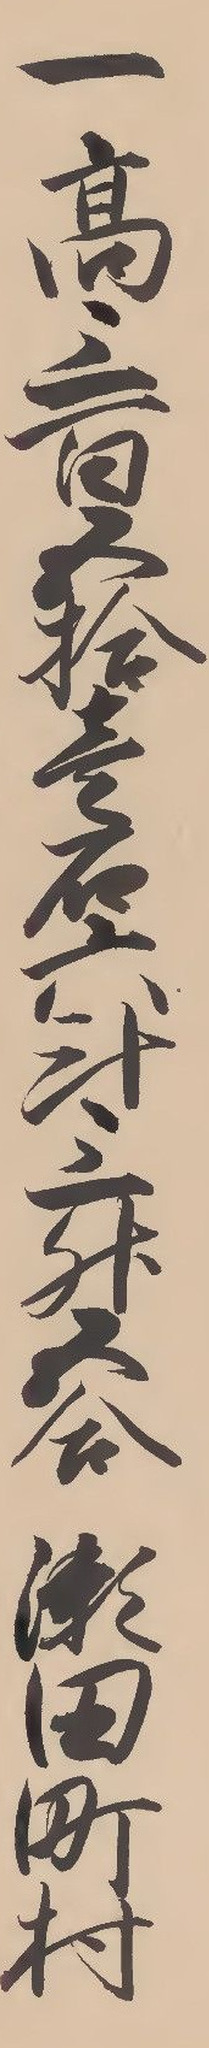一高三百五拾壱石六斗三升五合瀬田町村
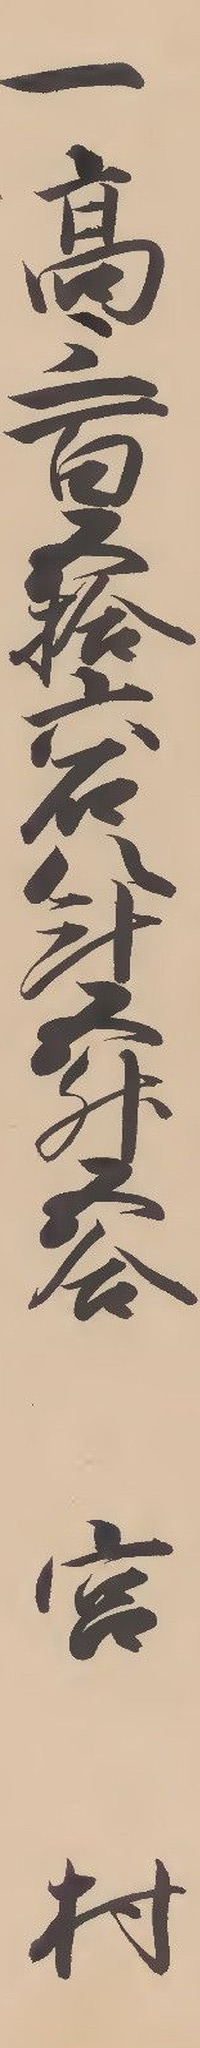一高三百五拾六石八斗五升五合宮村
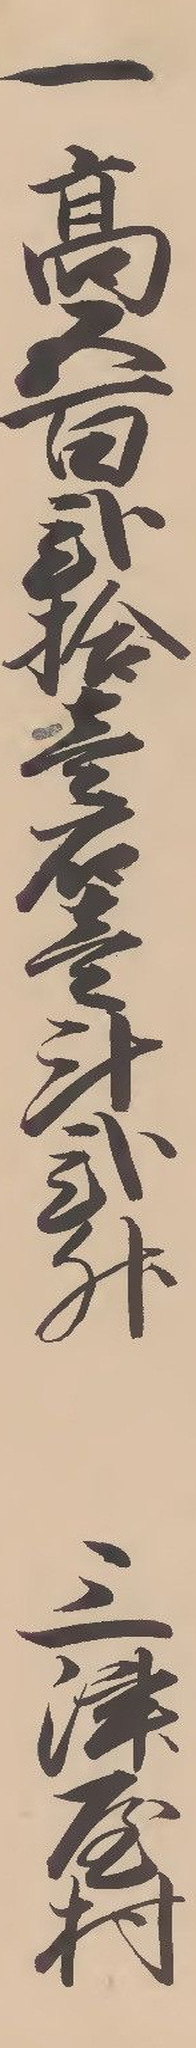一高五百弐拾壱石壱斗弐升三津屋村

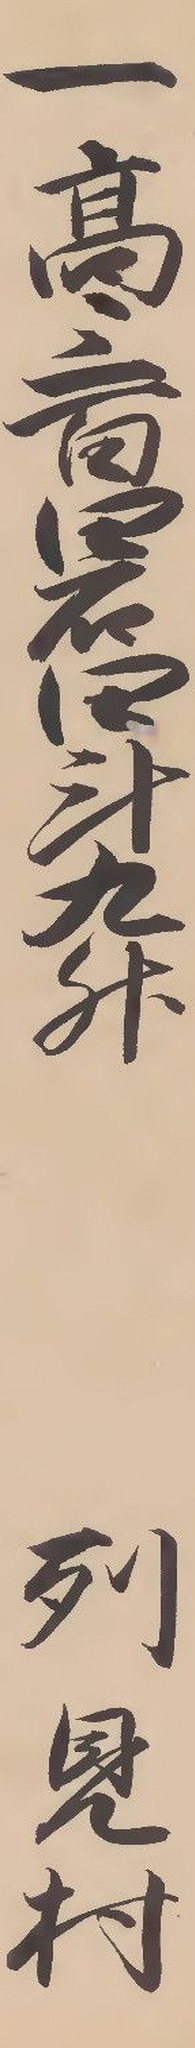一高三百四石四斗九升列見村
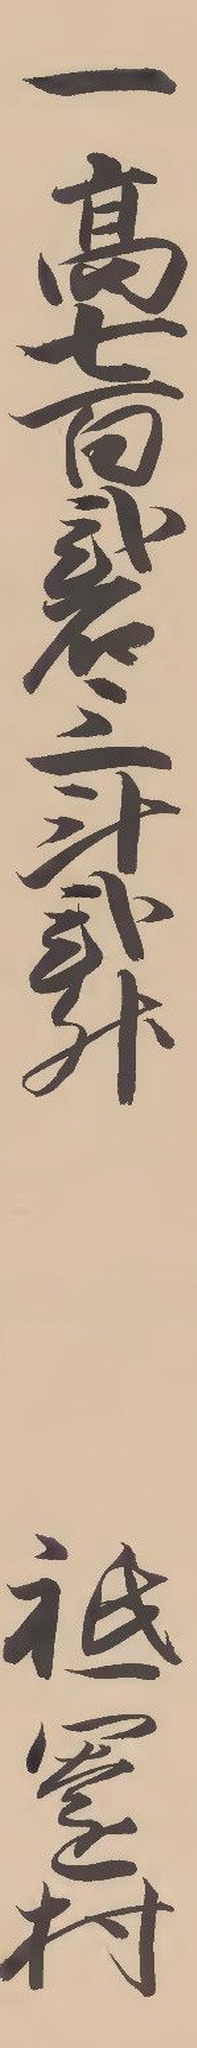一高七百弐石三斗弐升祇園村
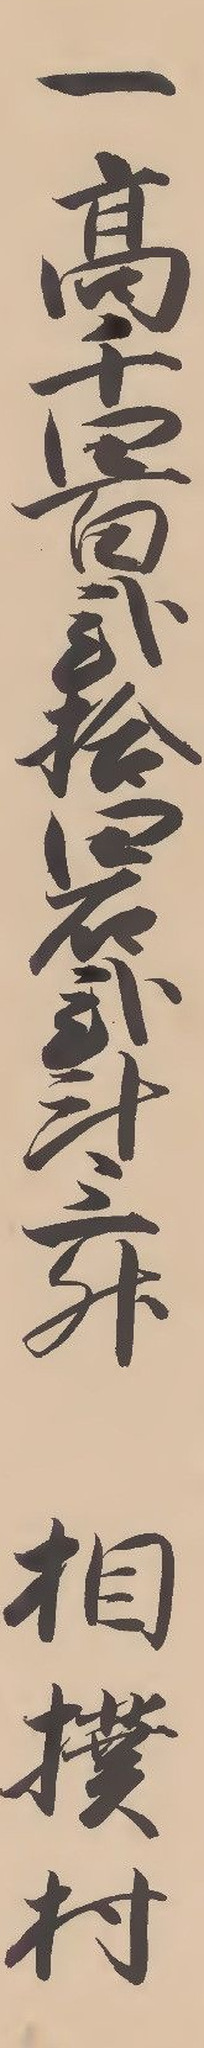一高千四百弐拾四石弐斗三升相撲村
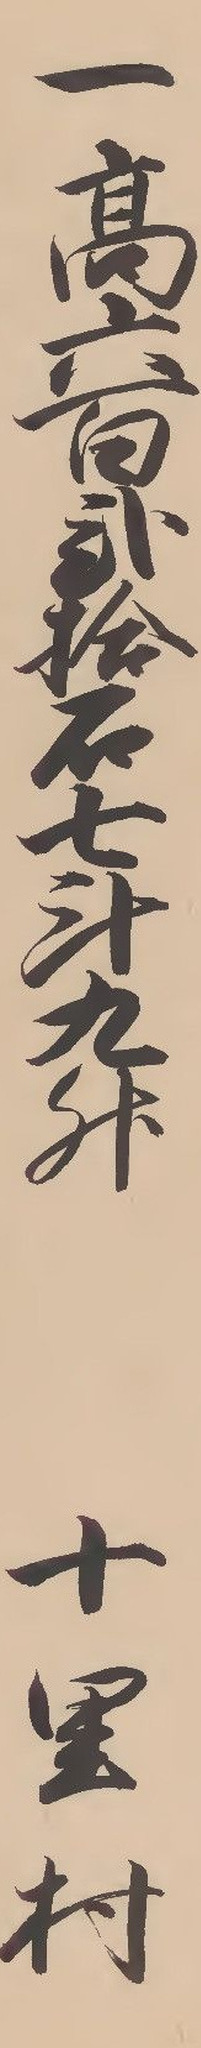一高六百弐拾石七斗九升十里村
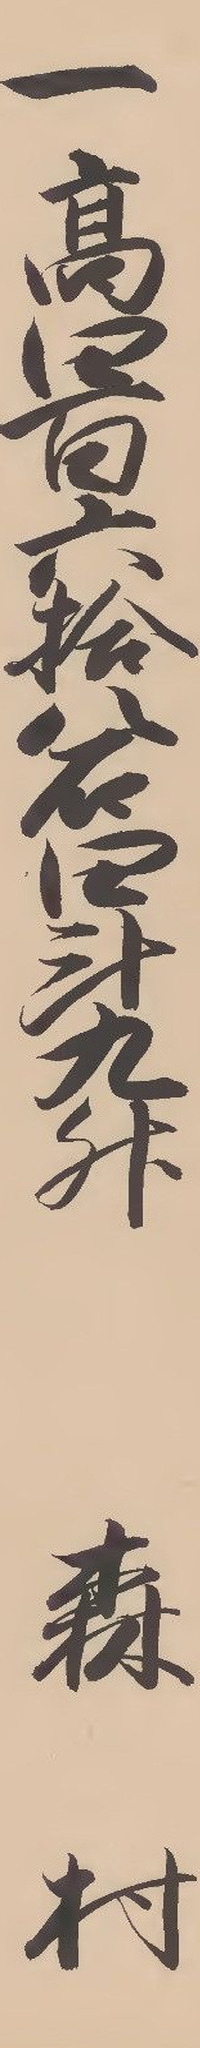一高四百六拾八石四斗九升森村
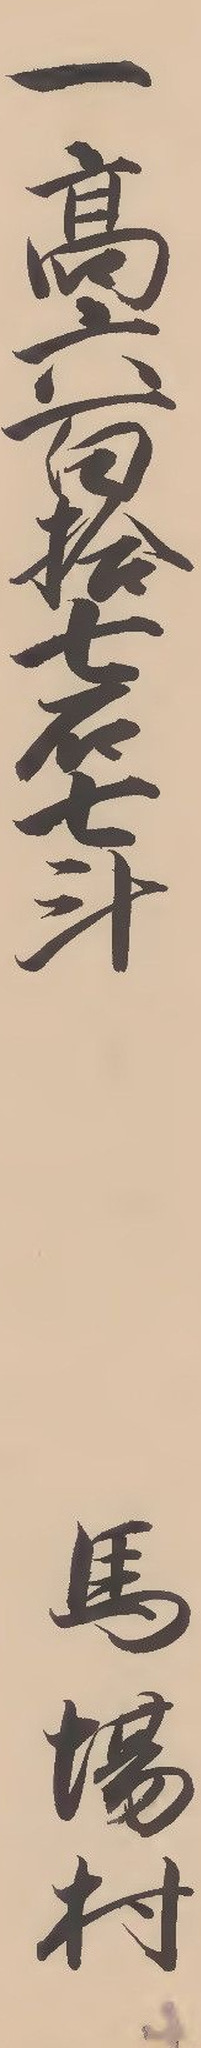一高六百拾七石七斗馬場村
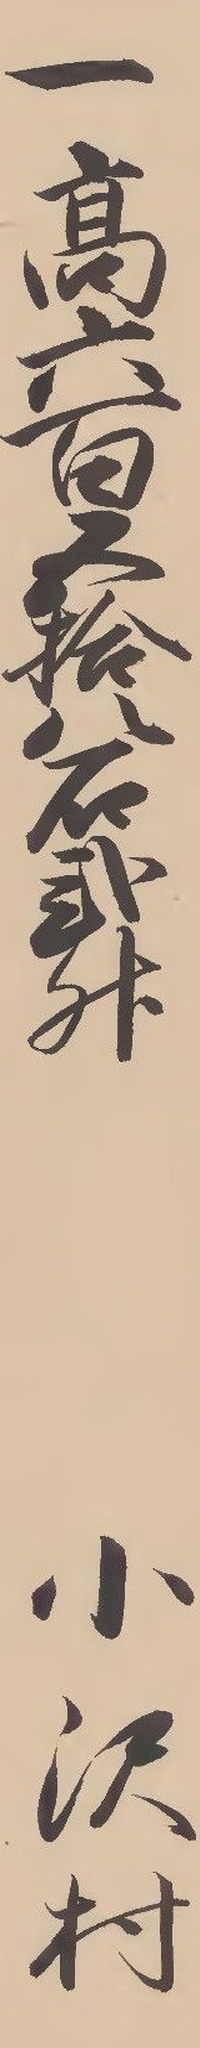一高六百五拾八石弐升小沢村
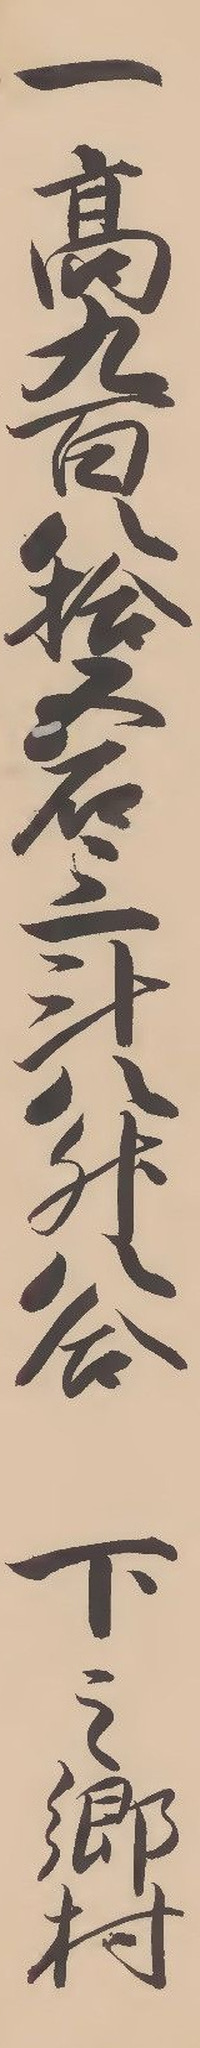一高九百八拾五石三斗八升八合下之郷村

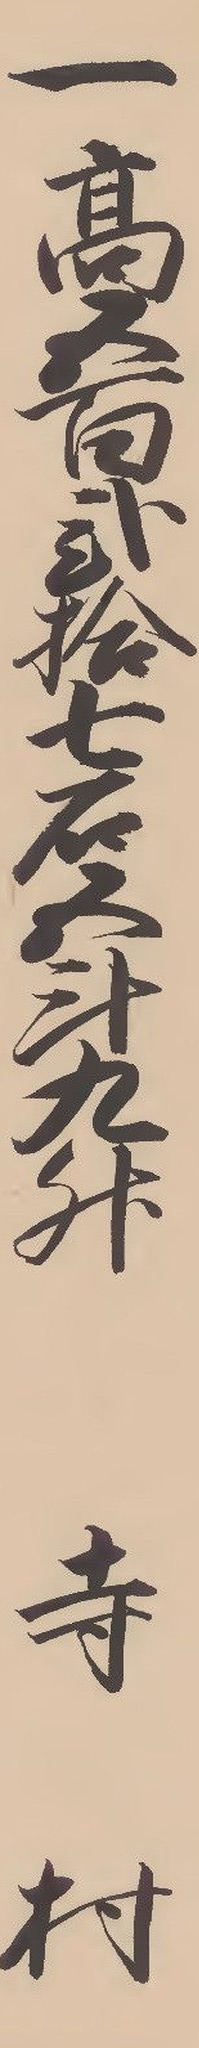一高五百弐拾七石五斗九升寺村
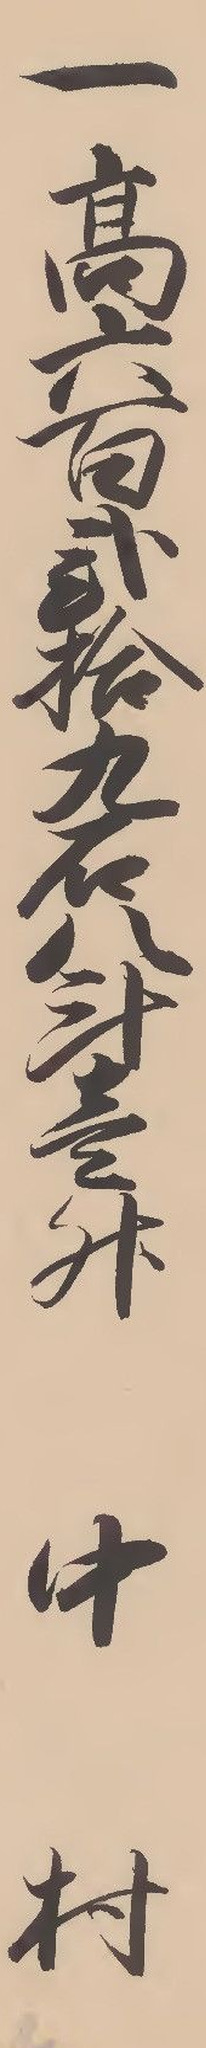一高六百弐拾九石八斗壱升中村
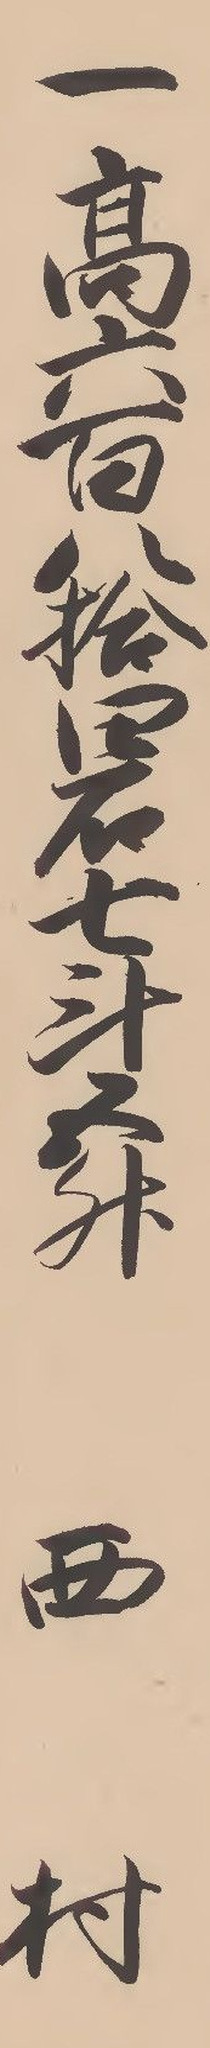一高六百八拾四石七斗五升西村
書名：近江国郷帳
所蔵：国立公文書館 National Archives of Japan
